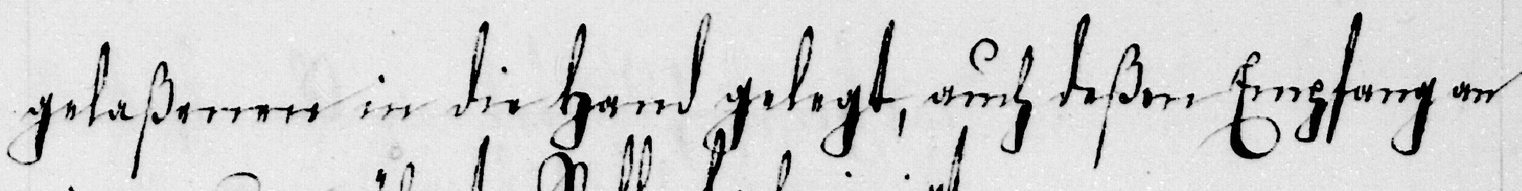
gelaßenen in die Hand gelegt, auch deßen Empfang an
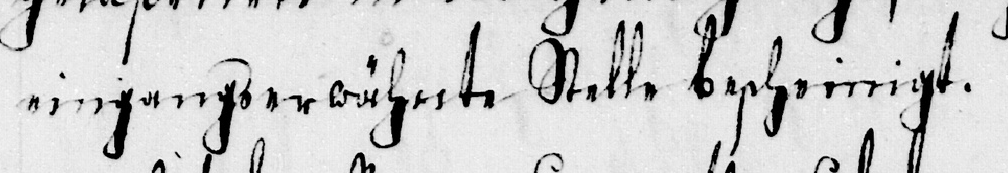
eingangs erwähnte Stelle bescheinigt.
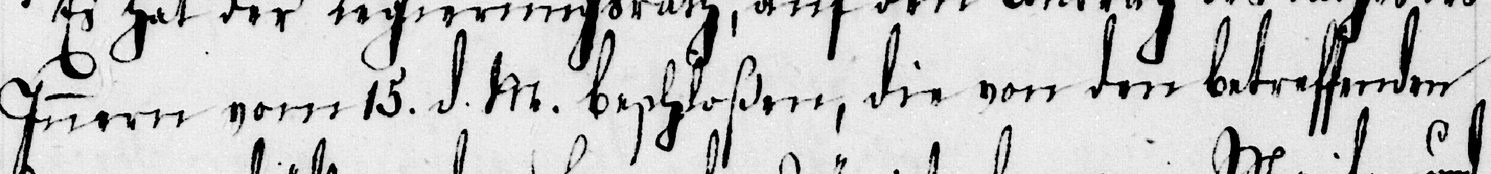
Innern vom 15. d. M. beschloßen, die von den betreffenden
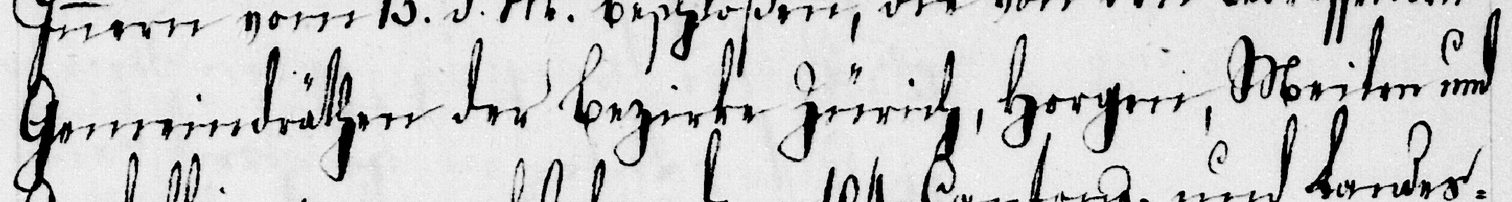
Gemeindräthen der Bezirke Zürich, Horgen, Meilen und
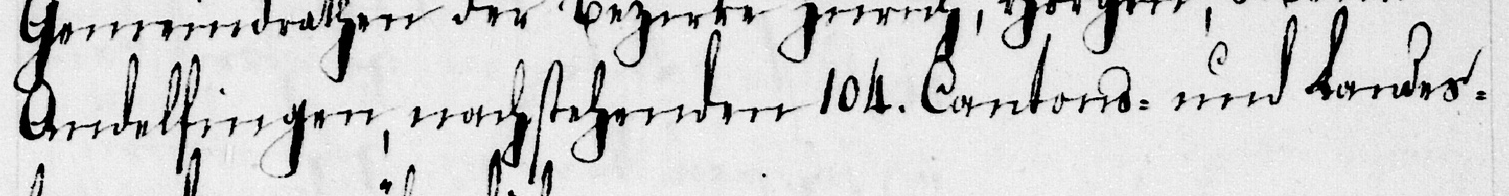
Andelfingen, nachstehenden 104. Cantons- und Landes¬
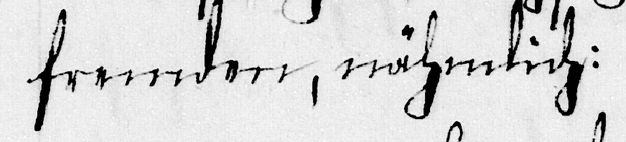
fremden, nähmlich:
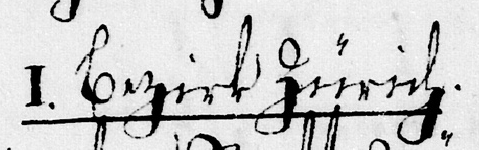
I. Bezirk Zürich.
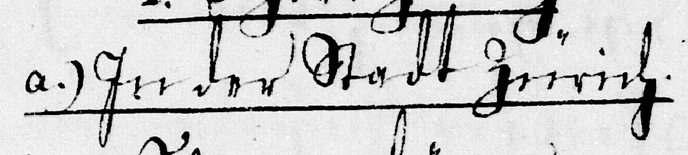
a.) In der Stadt Zürich.
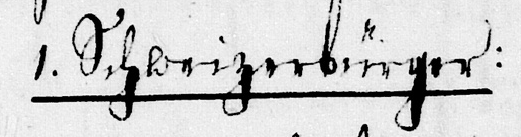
1. Schweizerbürger:
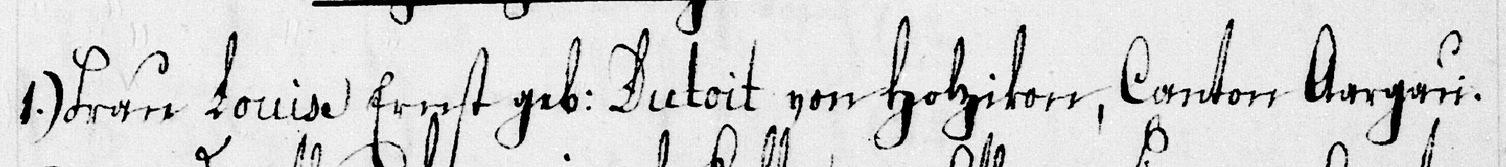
1.) Frau Louise Ernst geb. Dutoit von Holzikon, Canton Aargau.
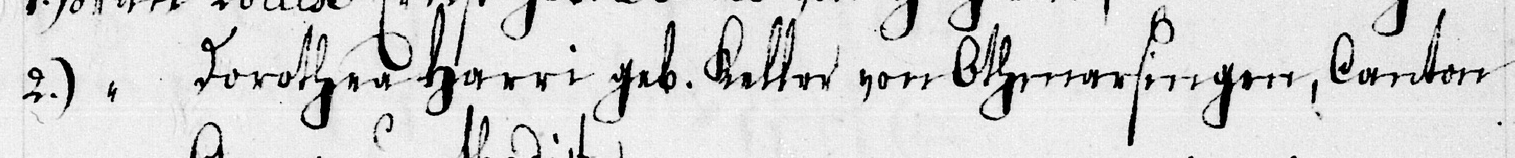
2.) “ Dorothea Harri geb. Keller von Othmarsingen, Canton
